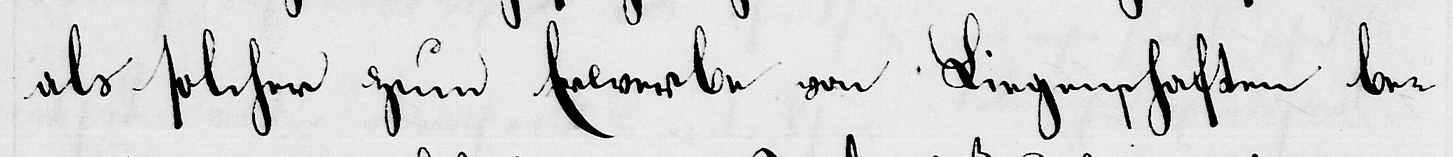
als solcher zum Erwerbe von Liegenschaften be¬
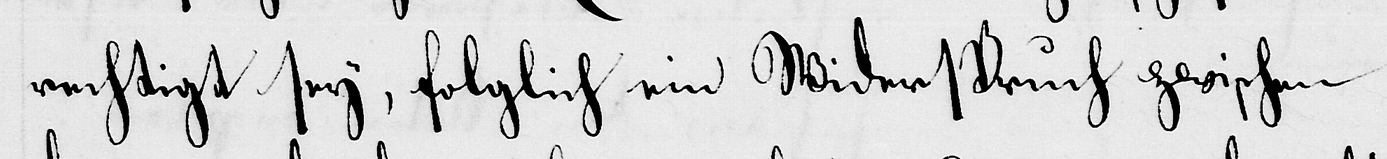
rechtigt sey, folglich ein Widerspruch zwischen
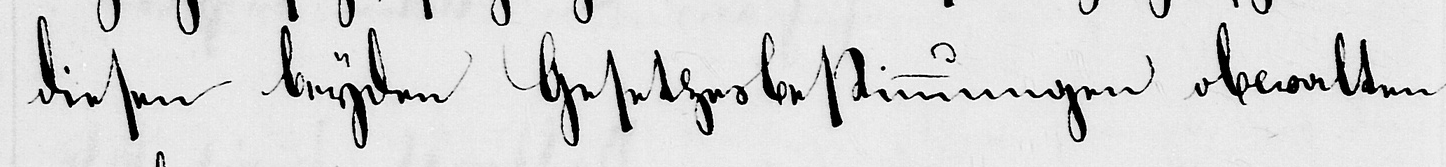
diesen beyden Gesetzesbestimmungen obwalten
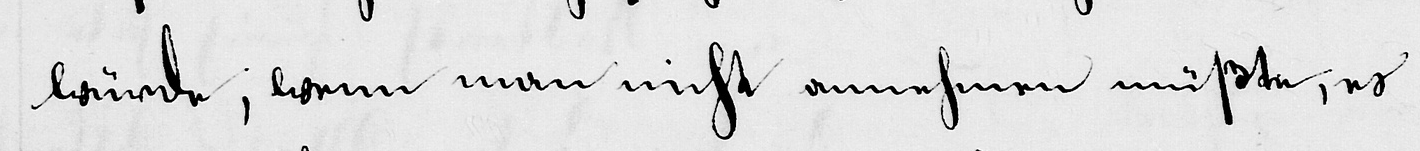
würde, wenn man nicht annehmen müsste, es
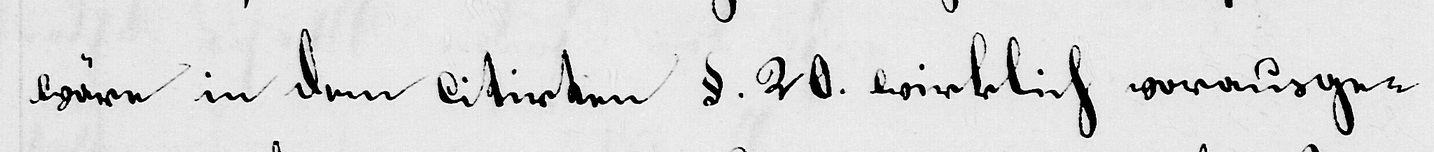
wäre in dem citirten §. 20. wirklich vorausge¬
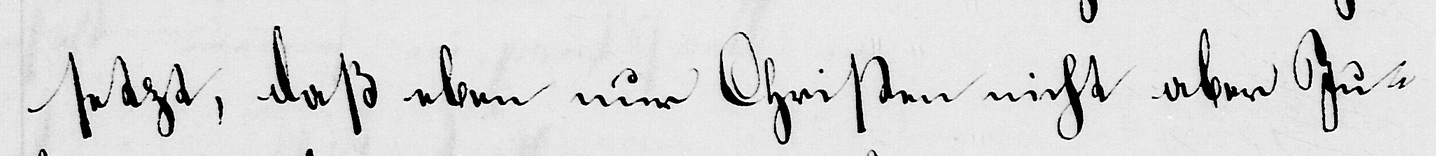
setzt, daß eben nur Christen nicht aber Ju¬
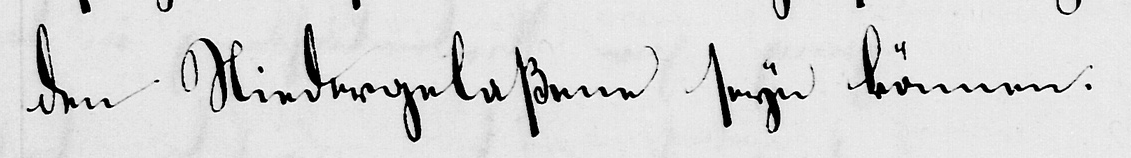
den Niedergelaßene seyn können.
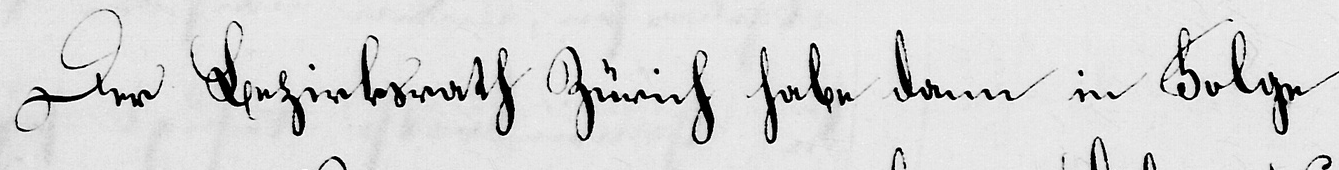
Der Bezirksrath Zürich habe dann in Folge
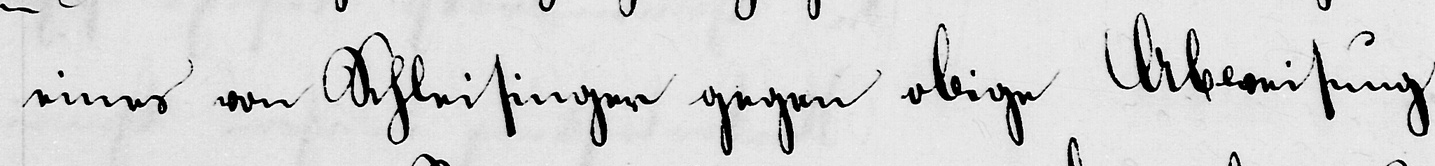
eines von Schleisinger gegen obige Abweisung
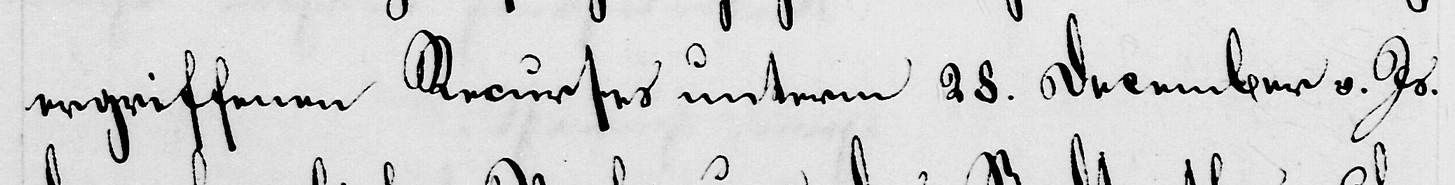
ergriffenen Recurses unterm 28. December v. Js.
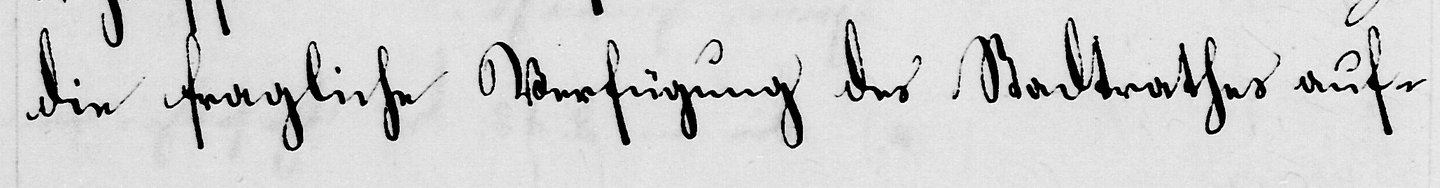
die fragliche Verfügung des Stadtrathes auf-
